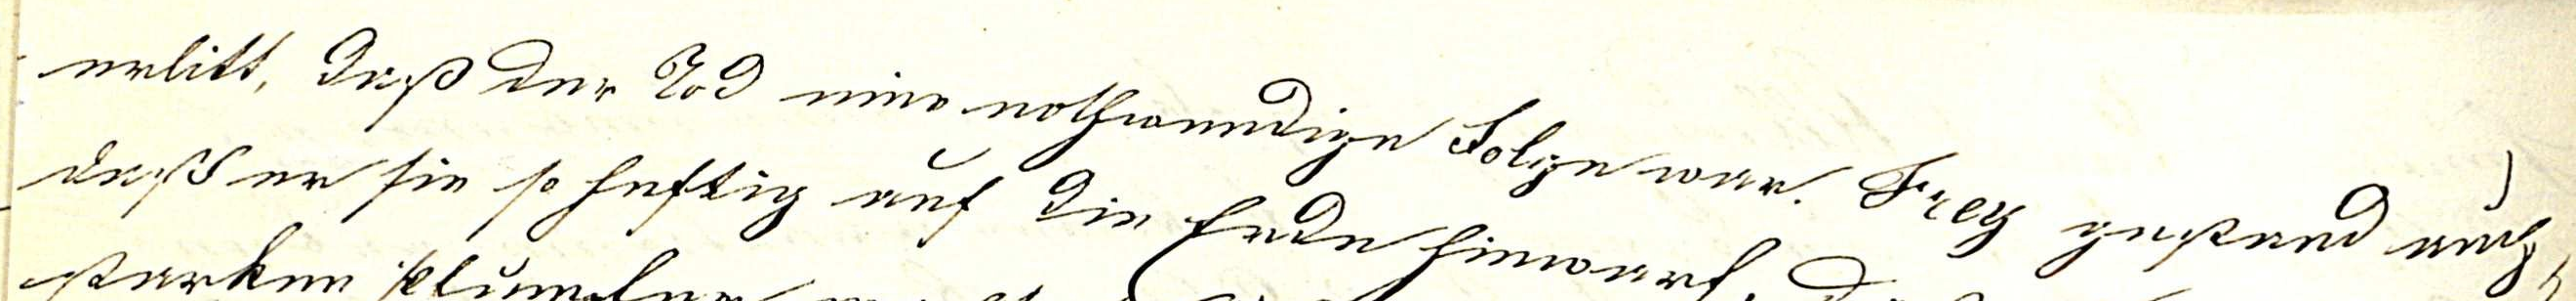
erlitt, daß der Tod eine nothwendige Folge war. Frey gestand auch
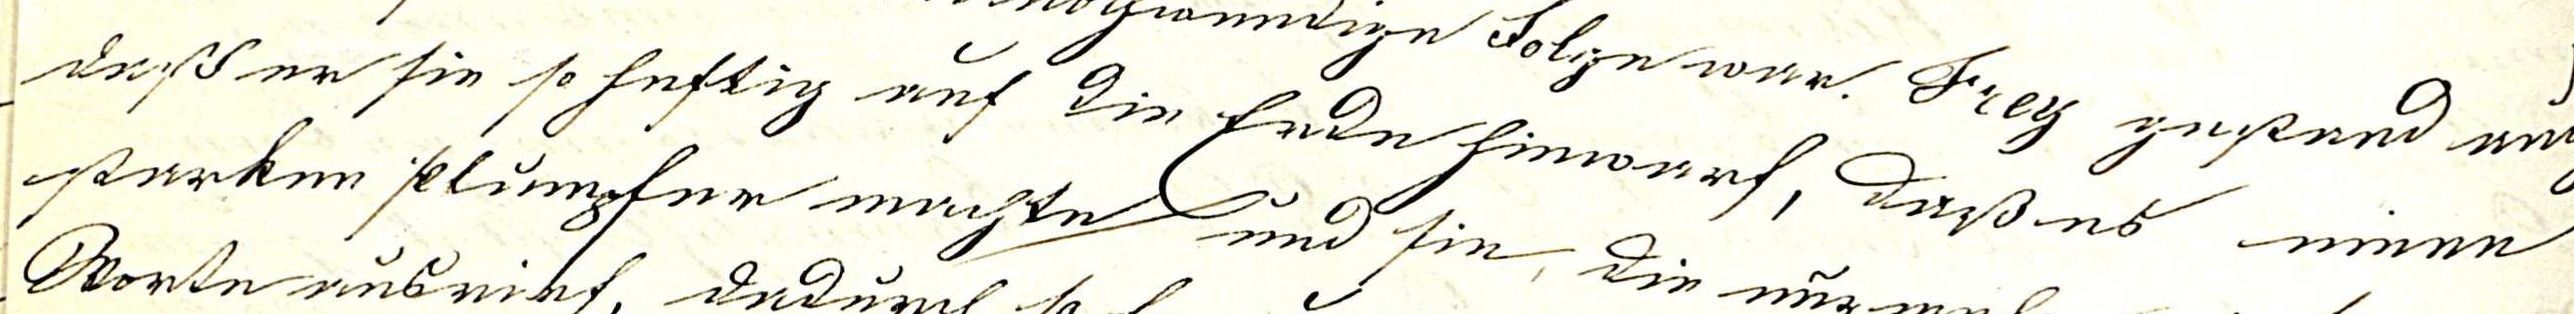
daß er sie so heftig auf die Erde hinwarf, daß es einen
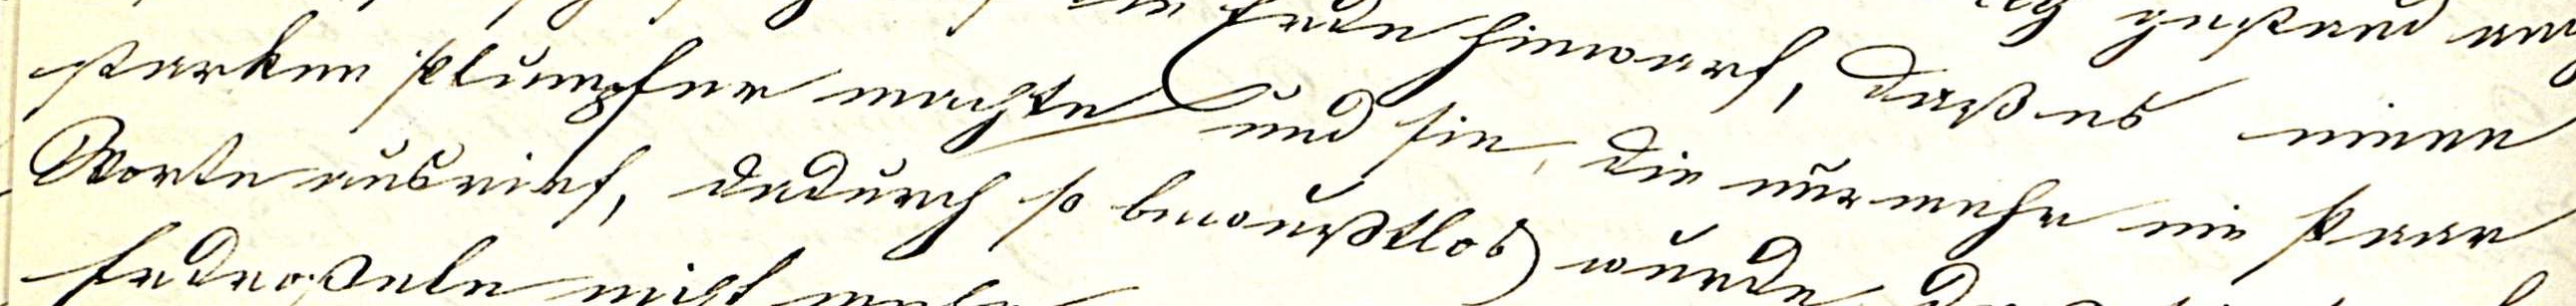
starken Plumpser machte und sie, die nur mehr ein Paar
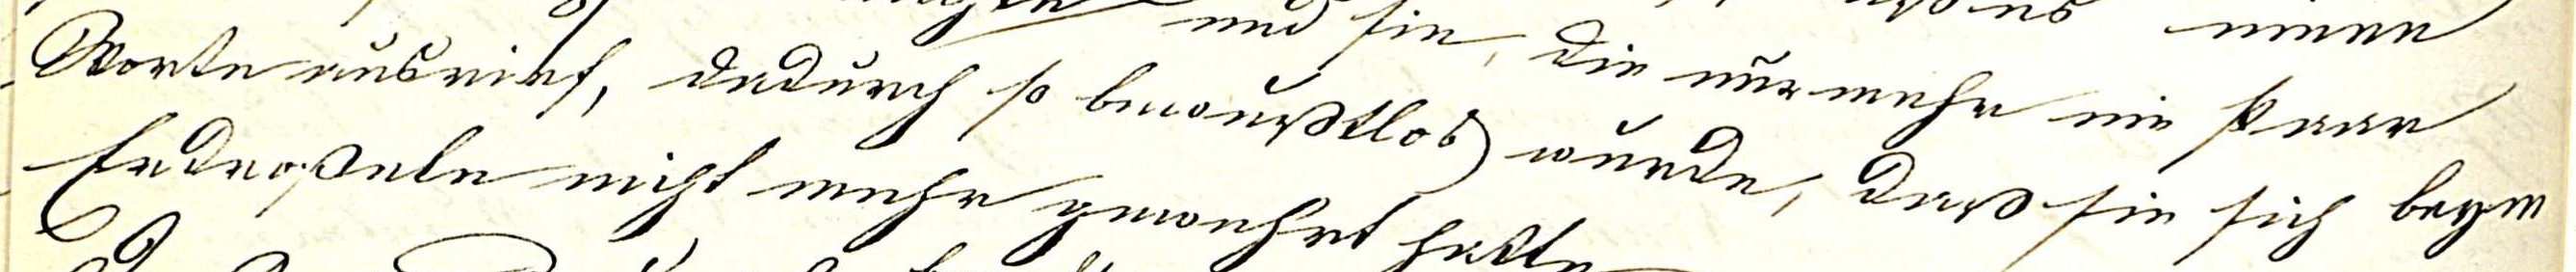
Worte ausrief, dadurch so bewußtlos wurde, daß sie sich beym
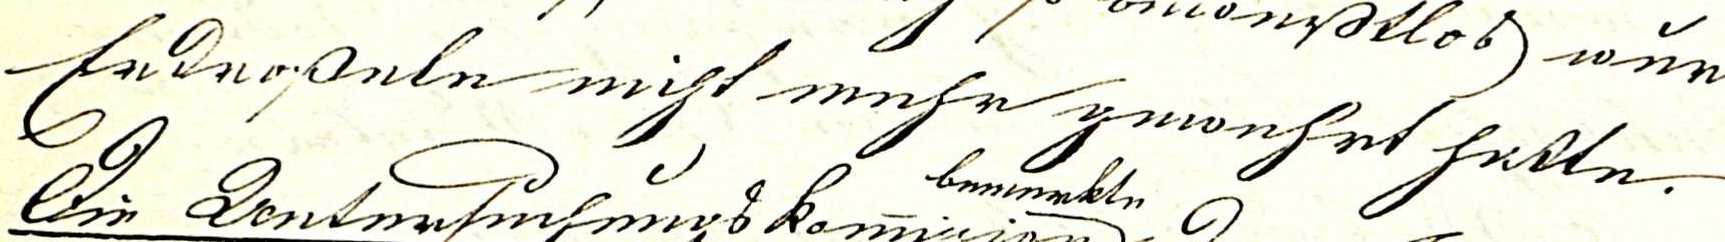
Erdroßeln nicht mehr gewehrt hatte.
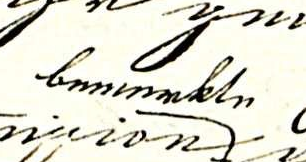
bemerkte
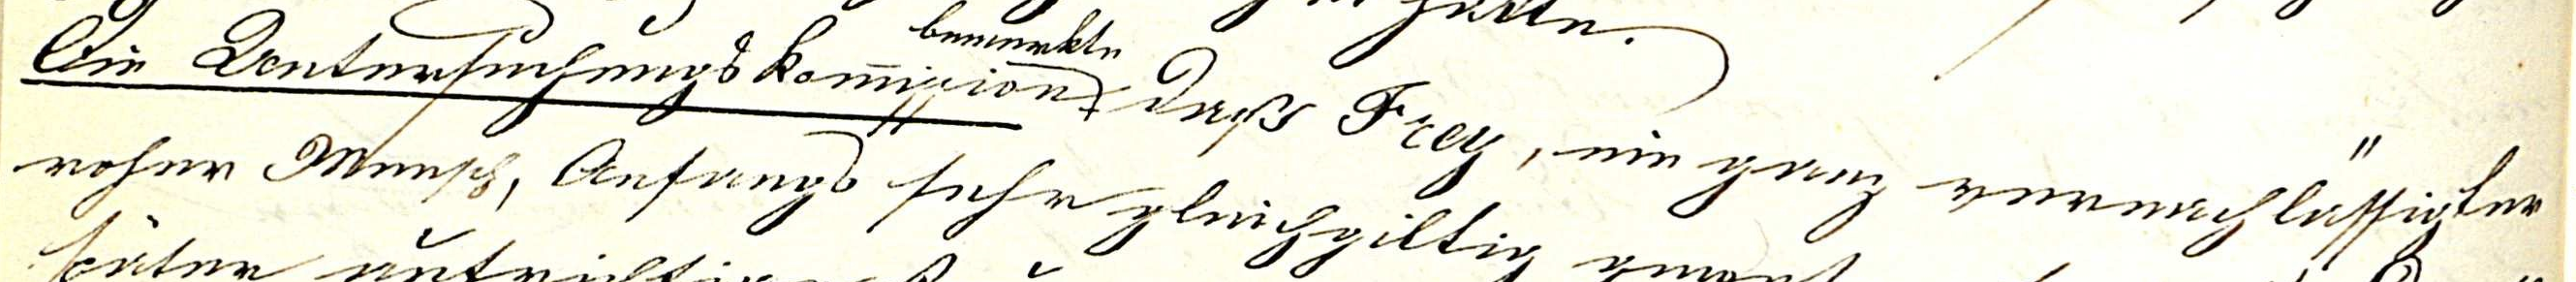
Die Untersuchungskommission daß Frey, ein ganz vernachlässigter
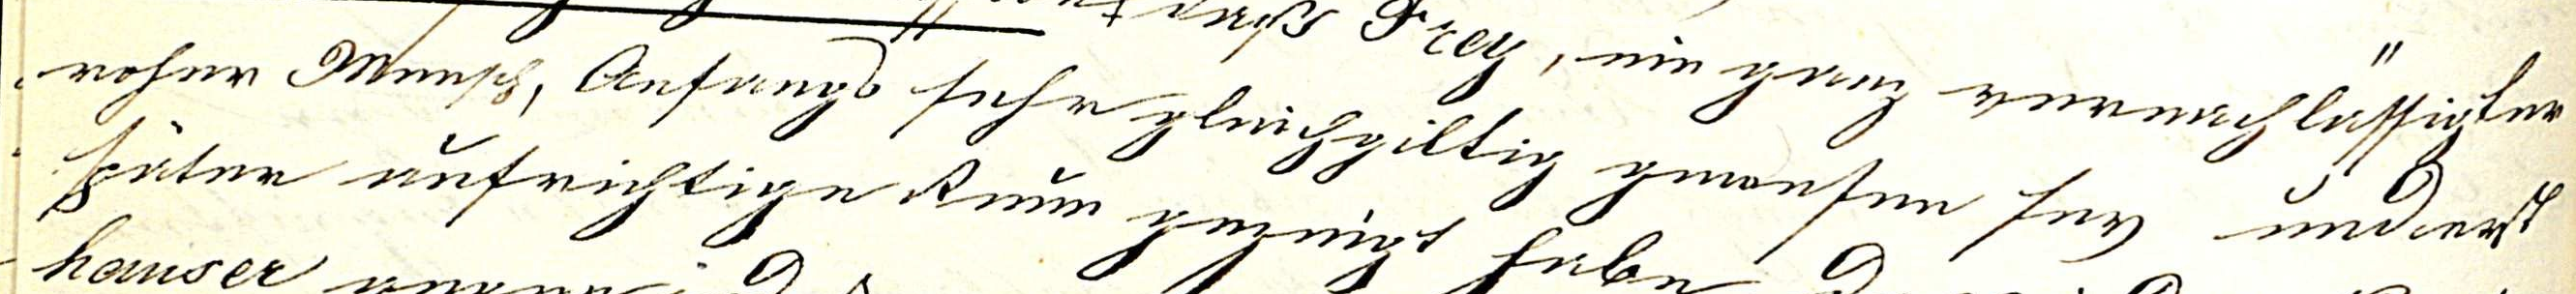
roher Mensch, Anfangs sehr gleichgiltig gewesen sey und erst
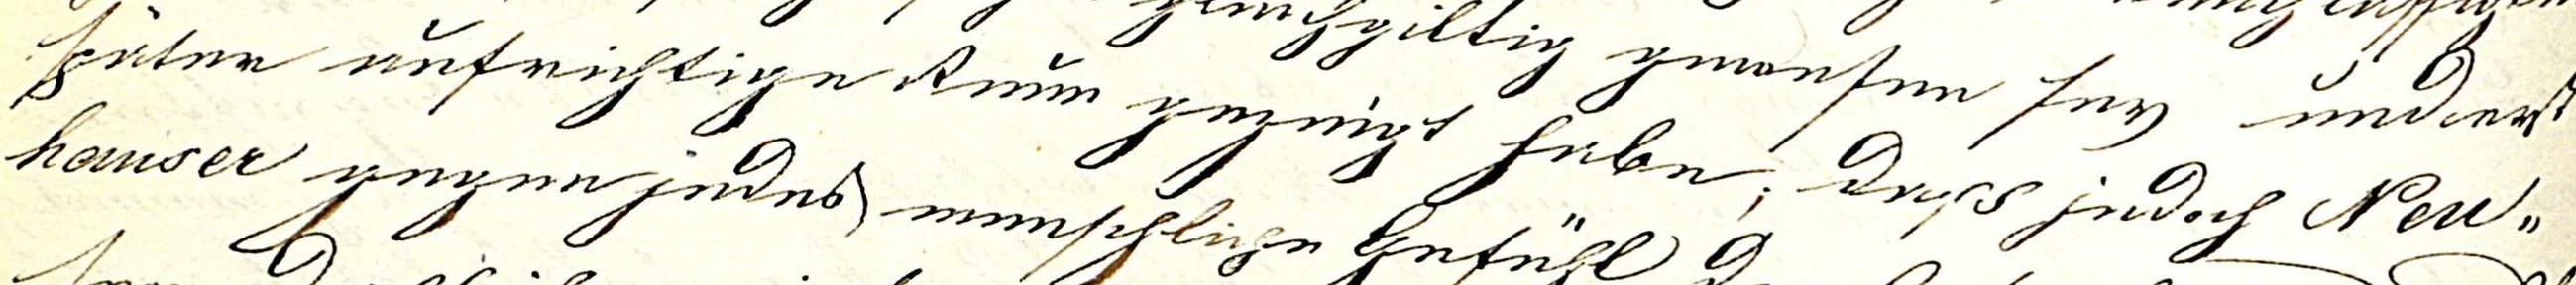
später aufrichtige Reue gezeigt habe; daß jedoch Neu¬
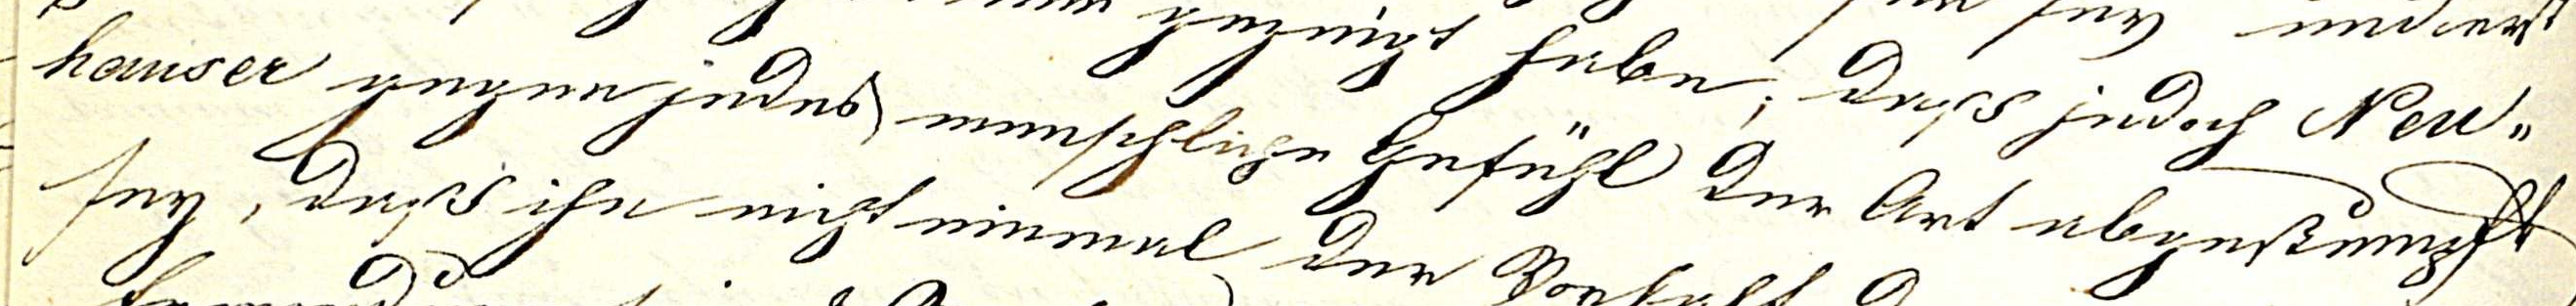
hauser gegen jedes menschliche Gefühl der Art abgestumpft
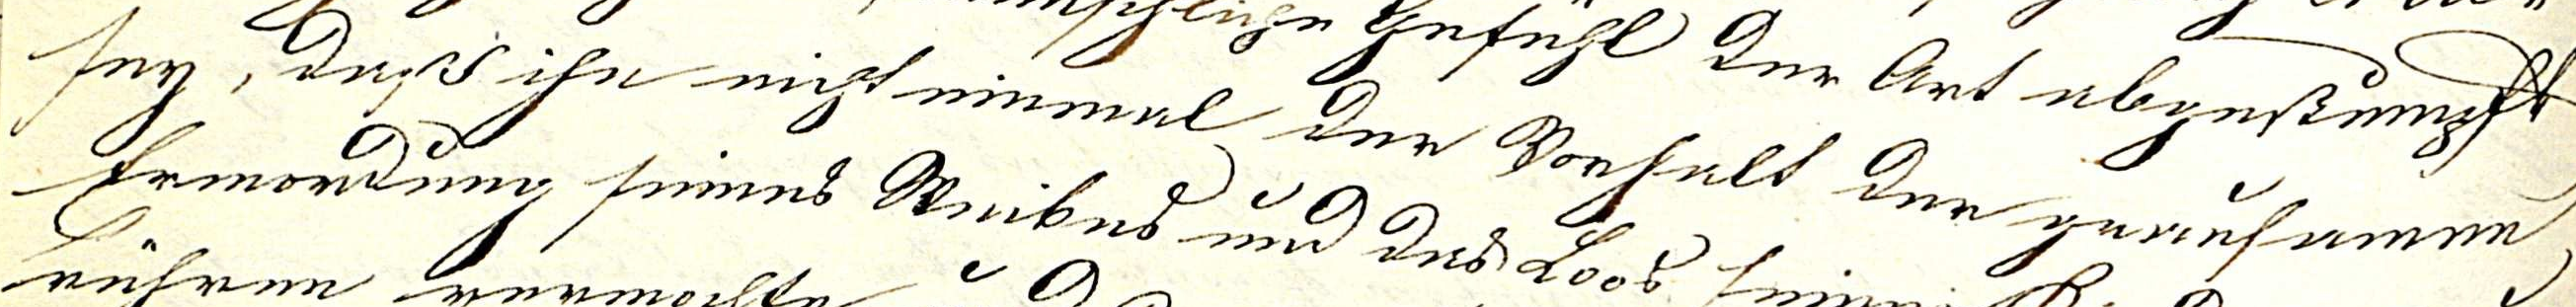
sey, daß ihn nicht einmal der Vorhalt der grausamen
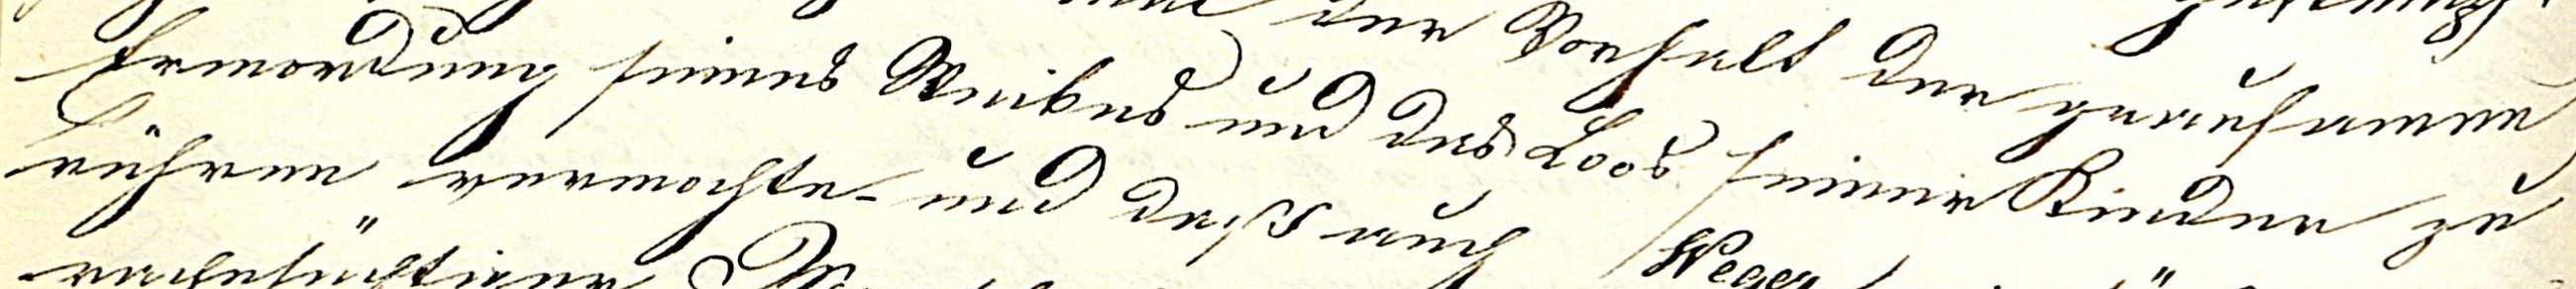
Ermordung seines Weibes und das Loos seiner Kinder zu
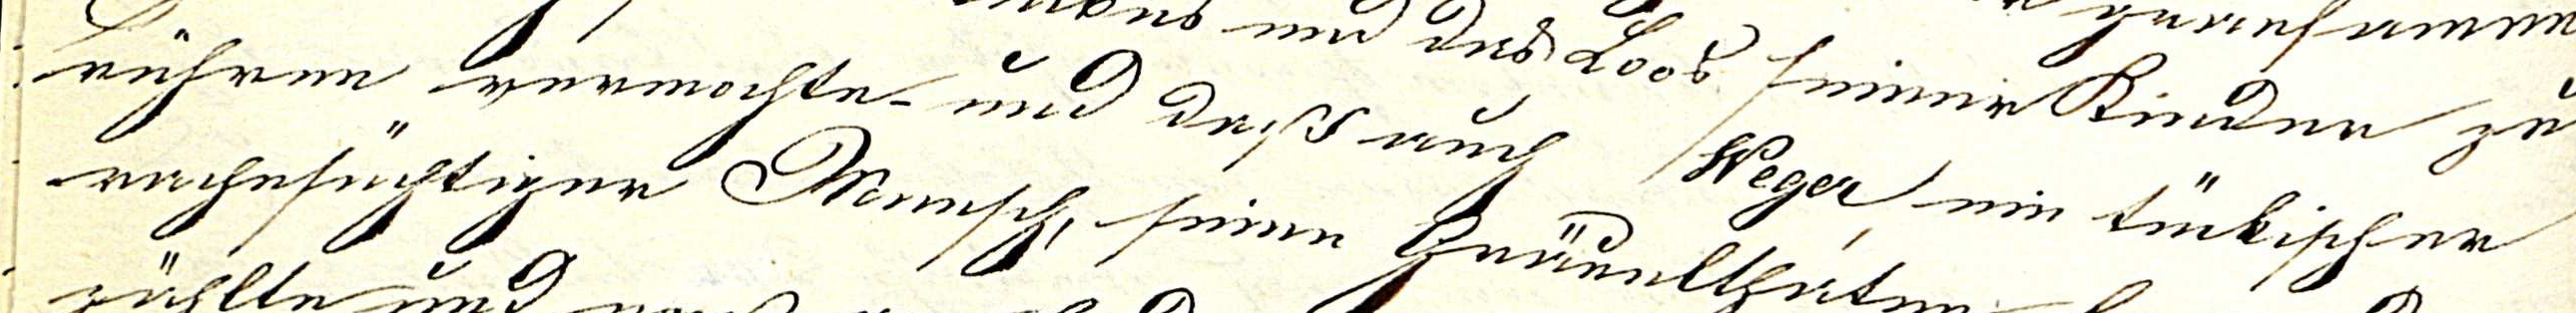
rühren vermochte und daß auch Weger, ein tückischer
